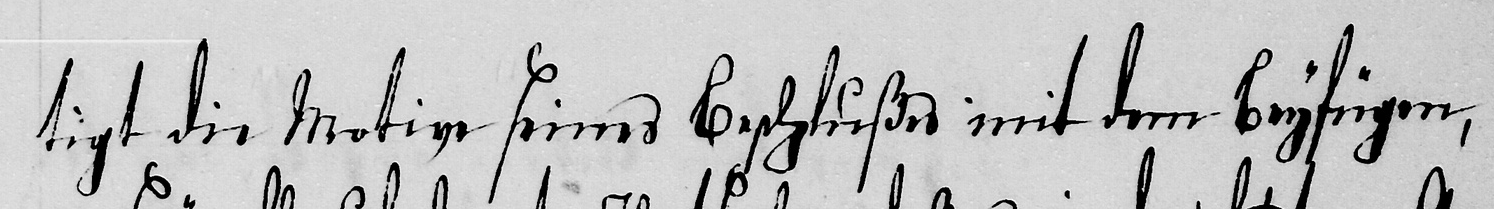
tigt die Motive seines Beschlußes mit dem Beyfügen,
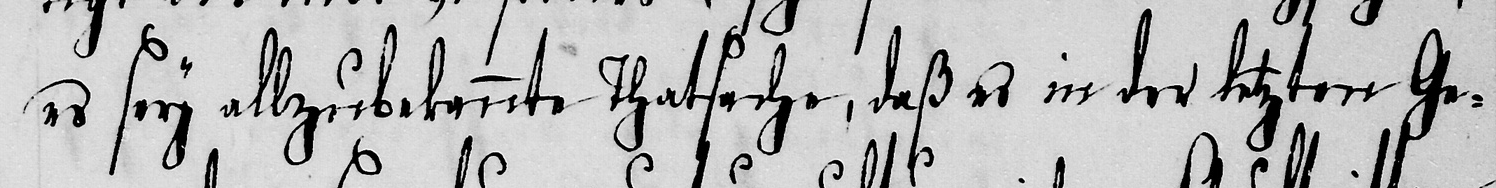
es sey allzubekannte Thatsache, daß es in der letzten Ge¬
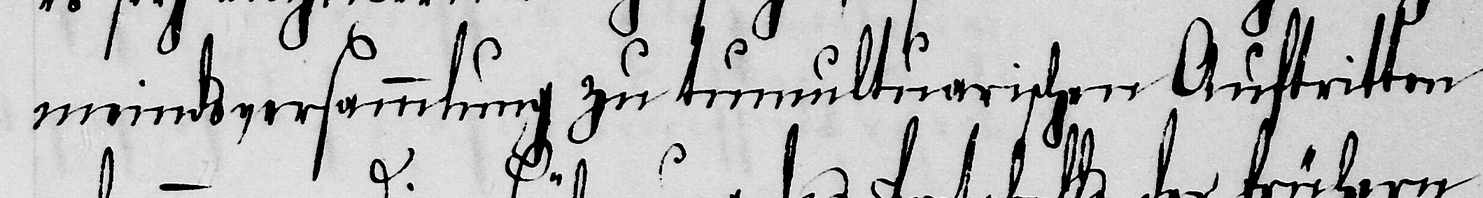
meindsversammlung zu tumultuarischen Auftritten
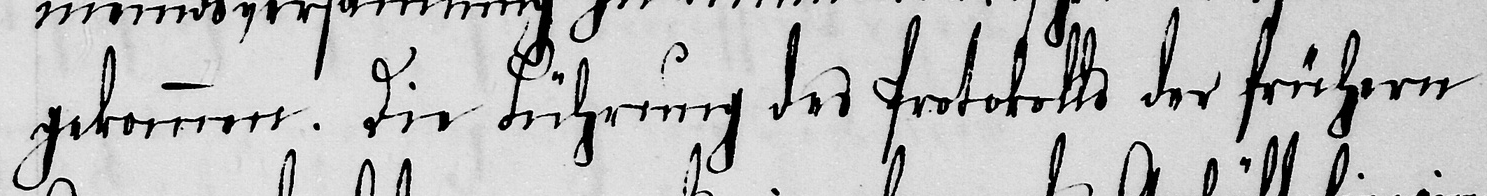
gekommen. Die Führung des Protokolls der frühern
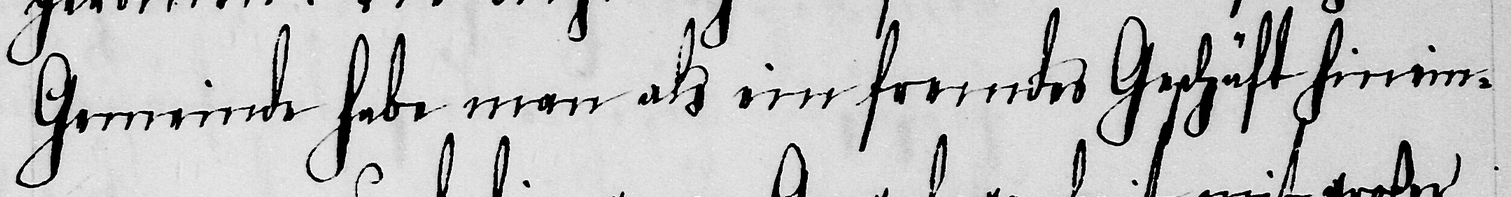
Gemeinde habe man als ein fremdes Geschäft hinein¬
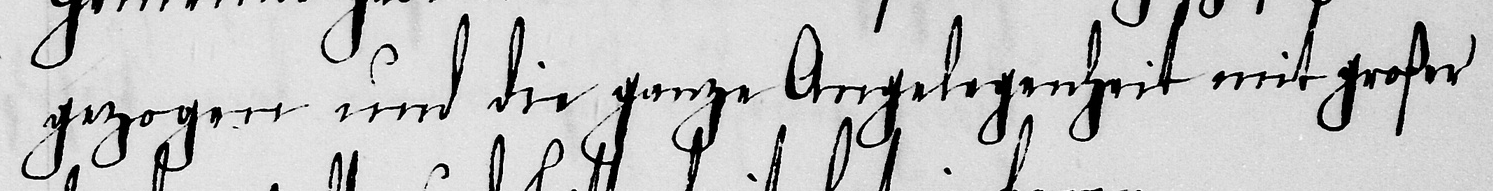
gezogen und die ganze Angelegenheit mit großer
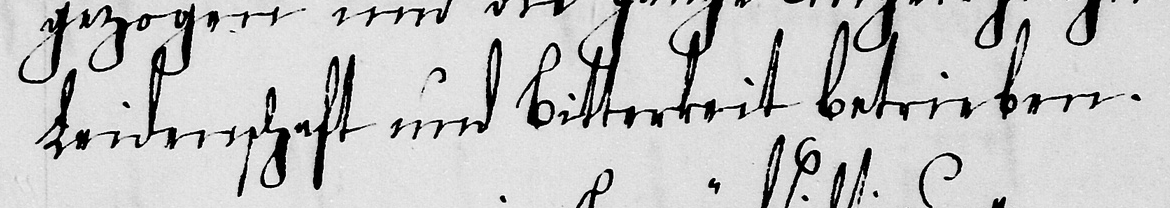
Leidenschaft und Bitterkeit betrieben.
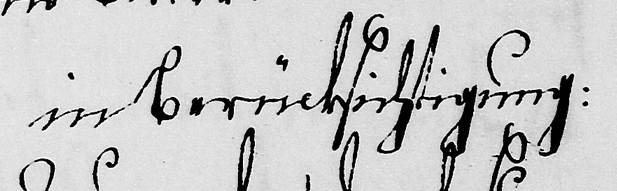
in Berücksichtigun¬
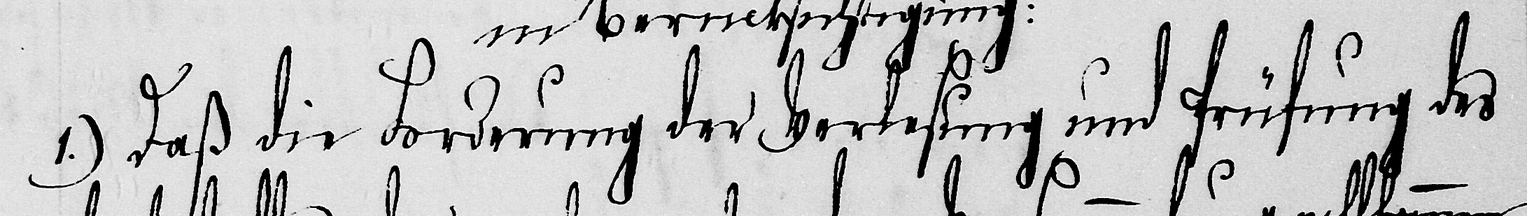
1.) Daß die Forderung der Verlesung und Prüfung des
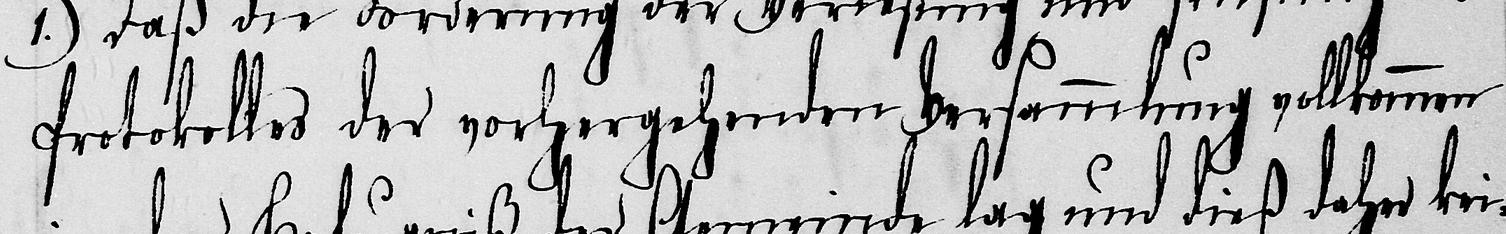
Protokolles der vorhergehenden Versammlung vollkom¬
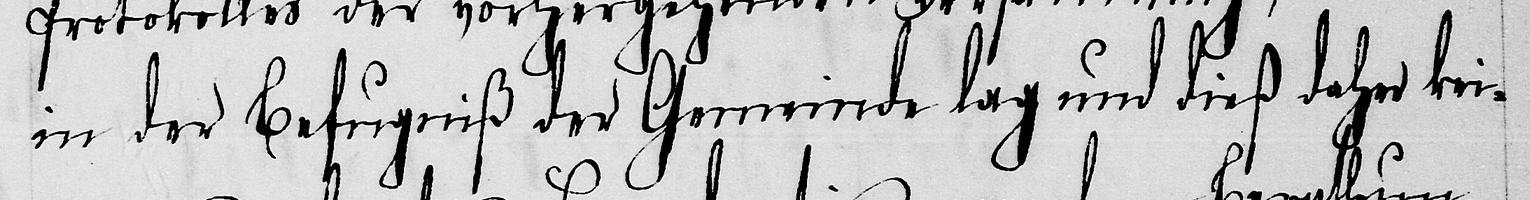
in der Befugniß der Gemeinde lag und dieß daher kei¬
